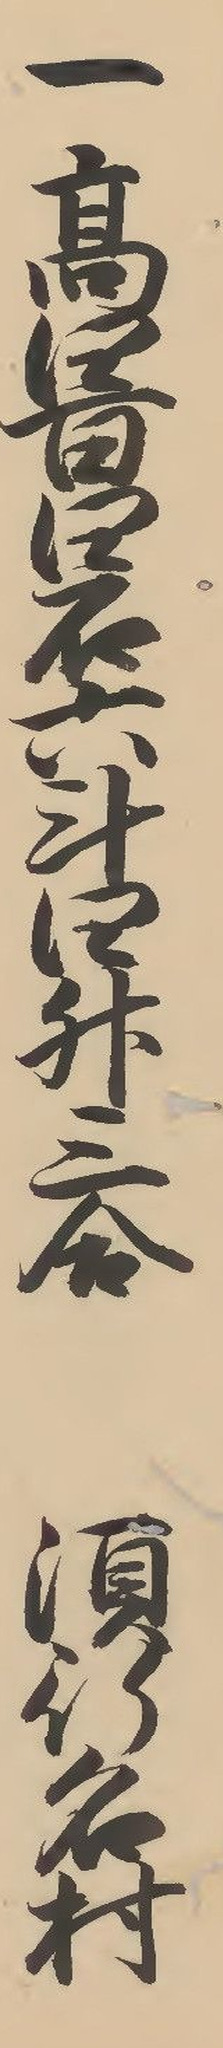一髙四百四石六斗四升三合須行名村
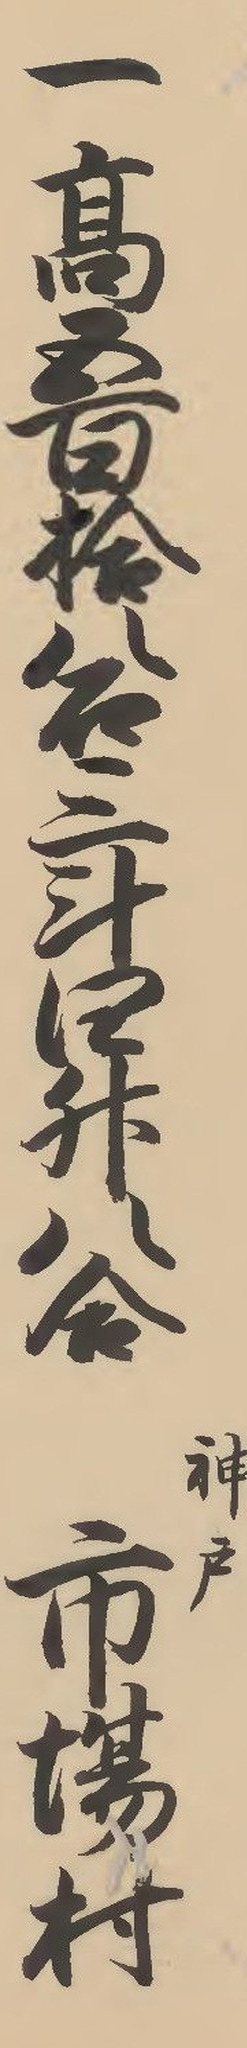一髙五百拾八石三斗四升八合市場村
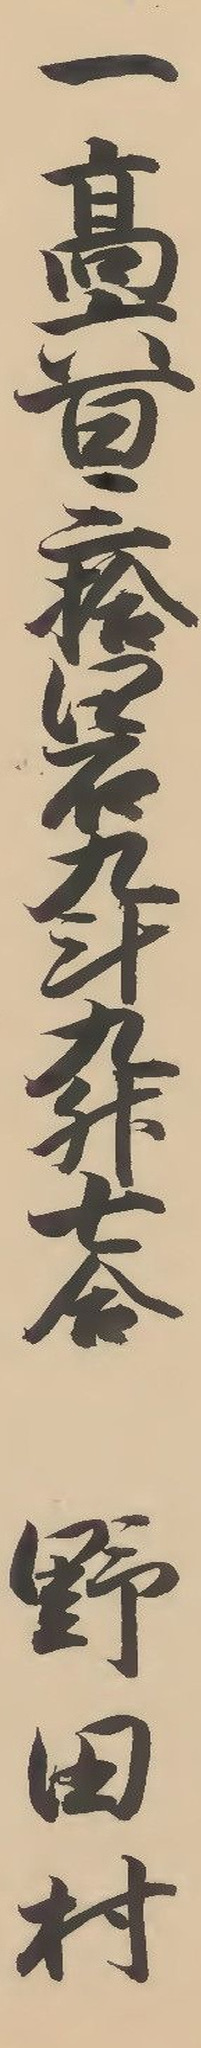一髙六百三拾四石九斗九升七合野田村
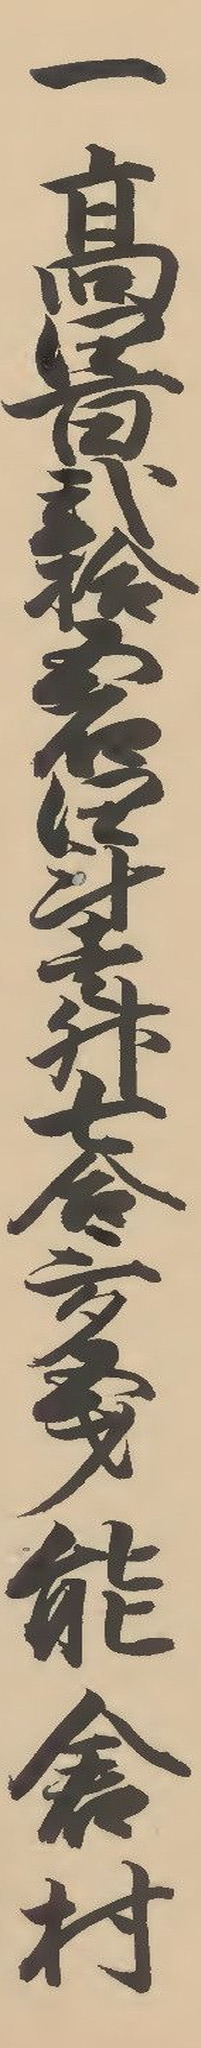一髙四百弐拾五石四斗七升七合三夕五才
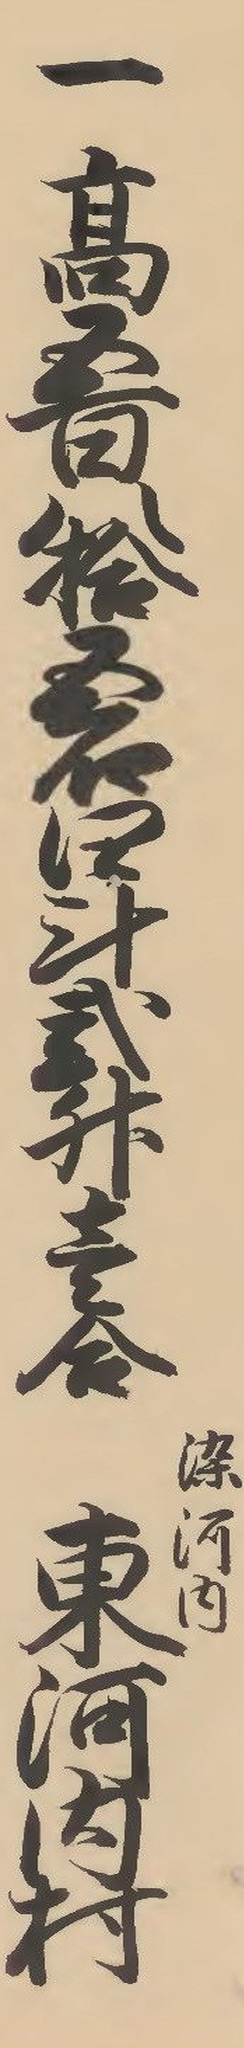一髙五百八拾五石四斗弐升壱合東河内村
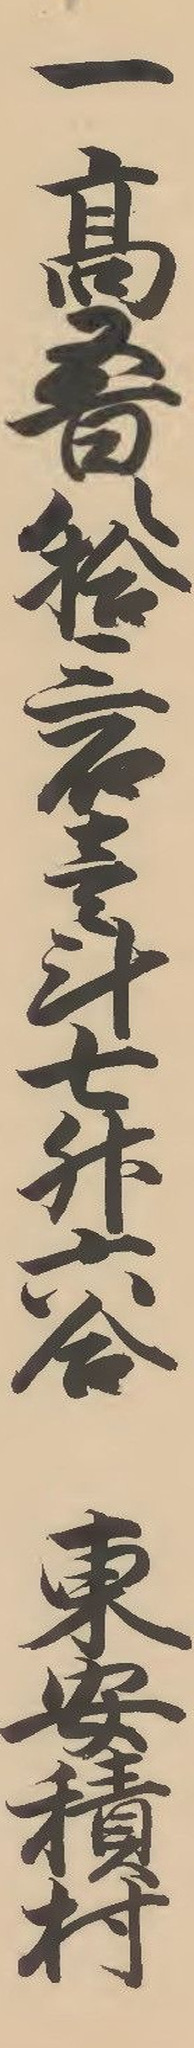一髙五百八拾三石壱斗七升六合東安積村
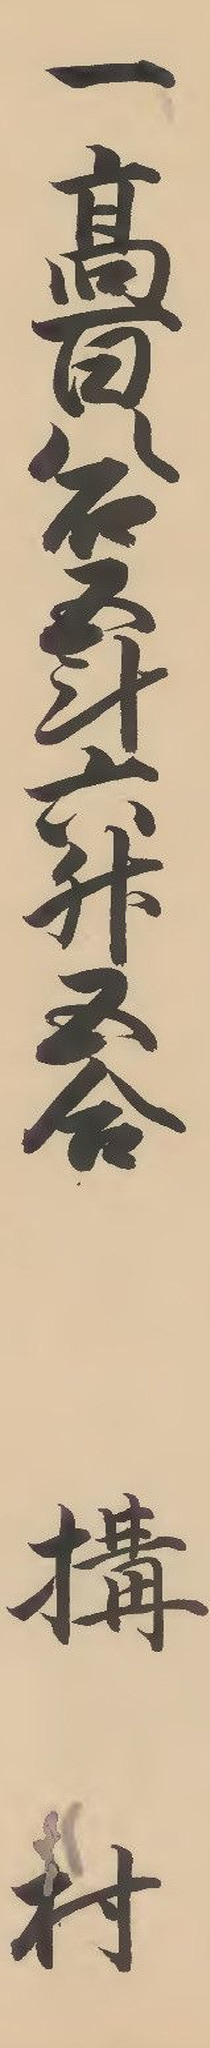一髙百八石五斗六升五合構村
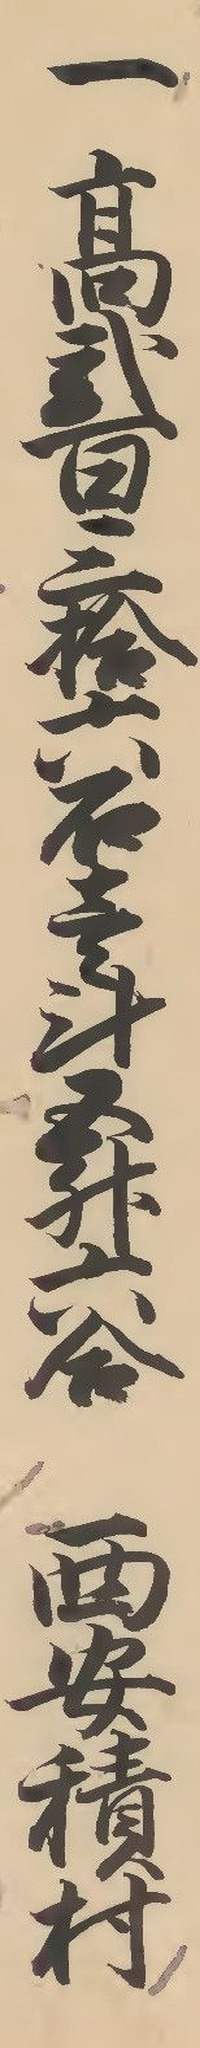一髙弐百三拾六石壱斗五升六合西安積村

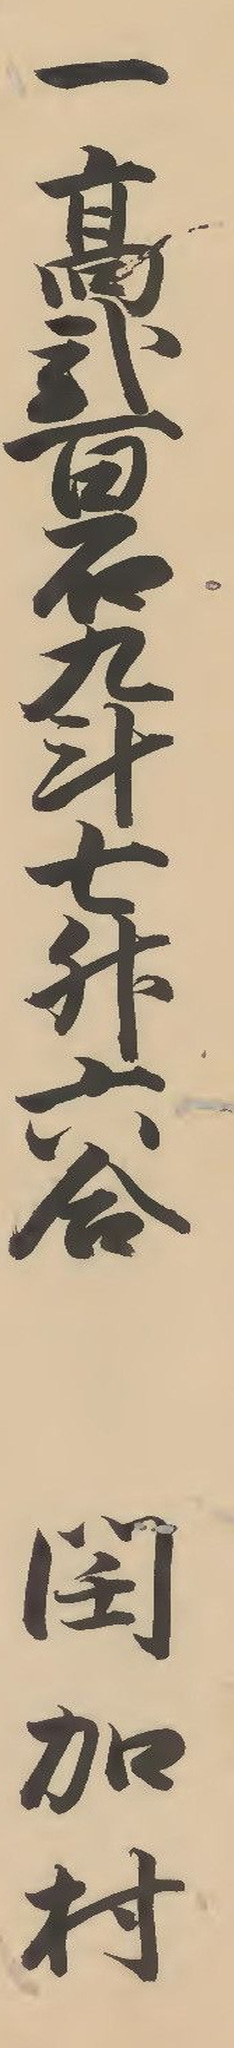一髙弐百石九斗七升六合閏加村
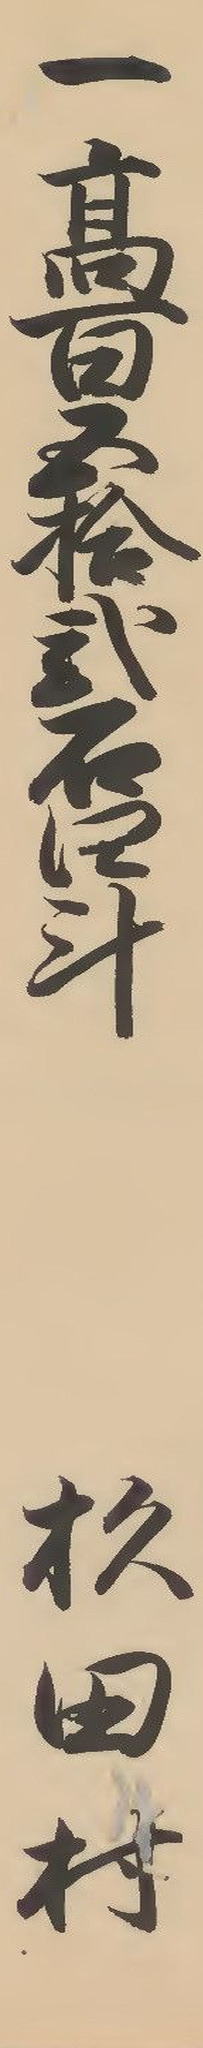一髙百五拾弐石四斗杦田村
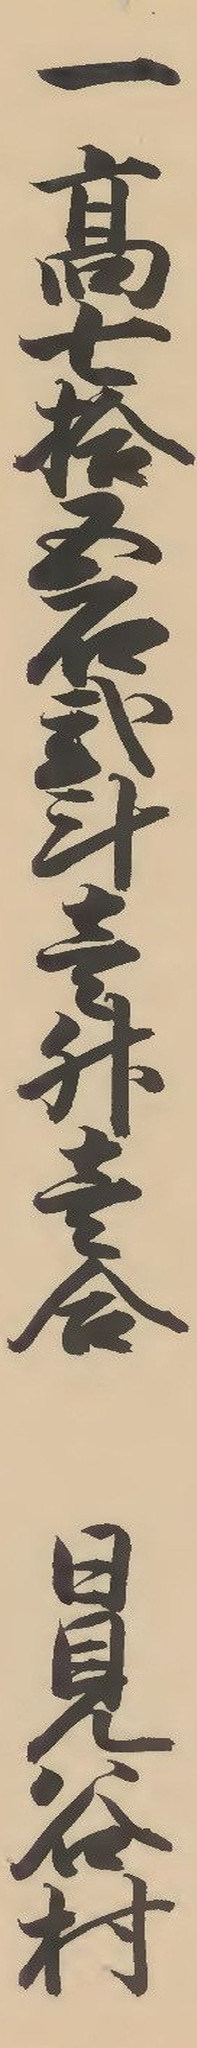一髙七拾五石弐斗壱升壱合日見谷村
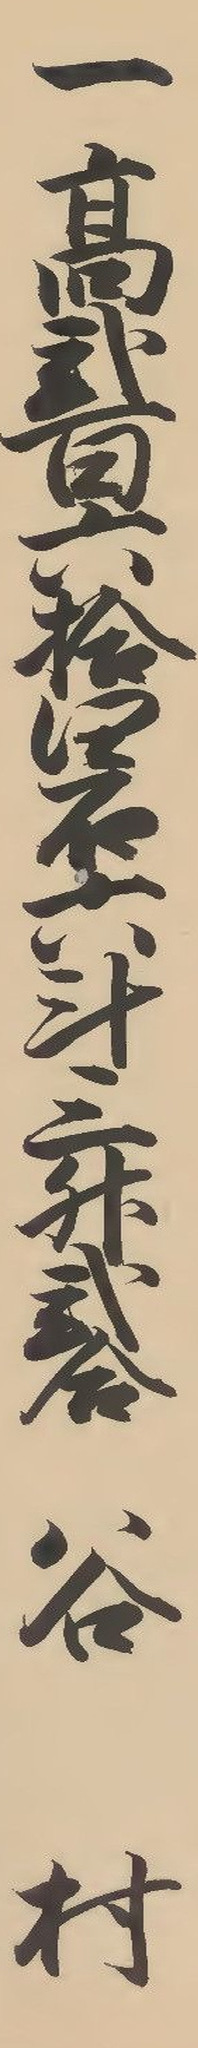一髙弐百六拾四石六斗三升弐合谷村
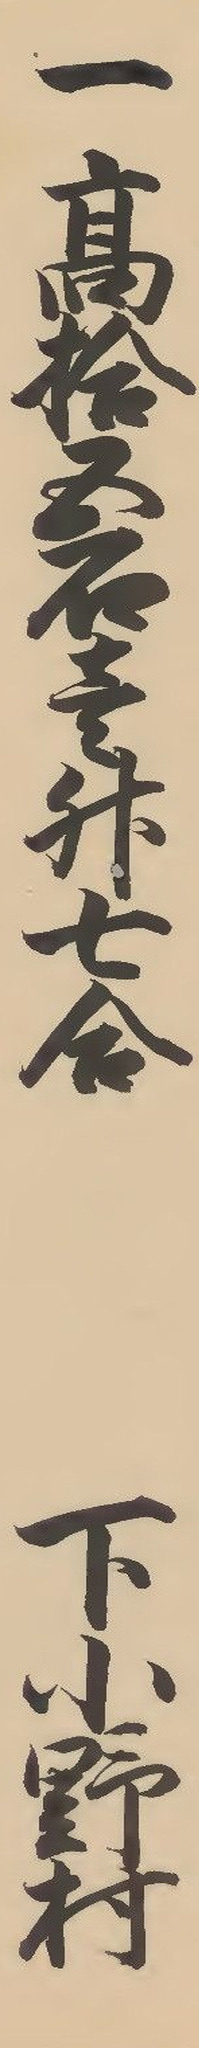一髙拾五石壱升七合下小野村
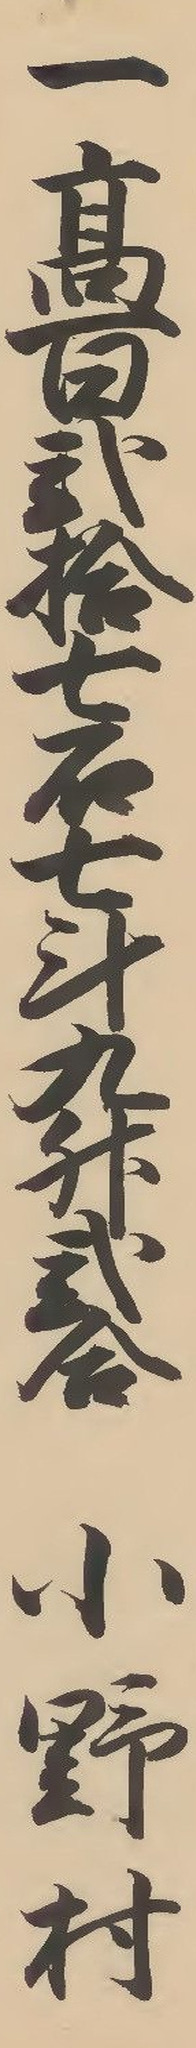一髙百弐拾七石七斗九升弐合小野村
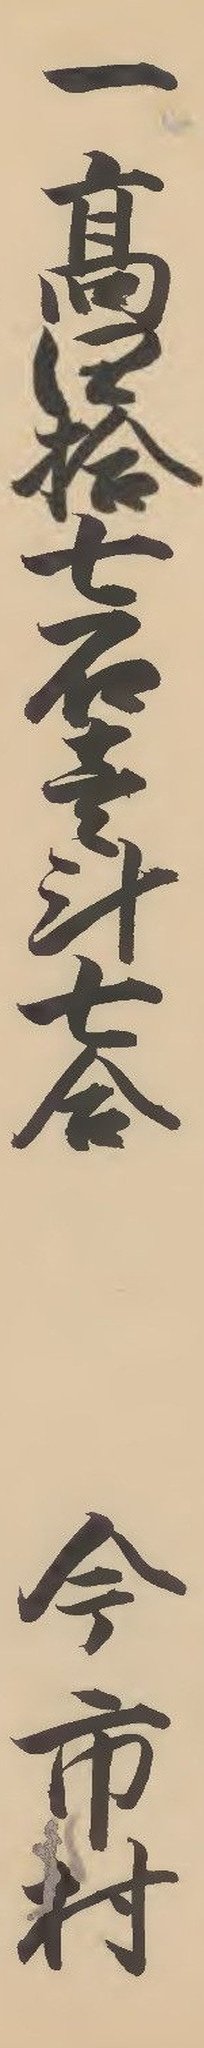一髙四拾七石壱斗七合今市村
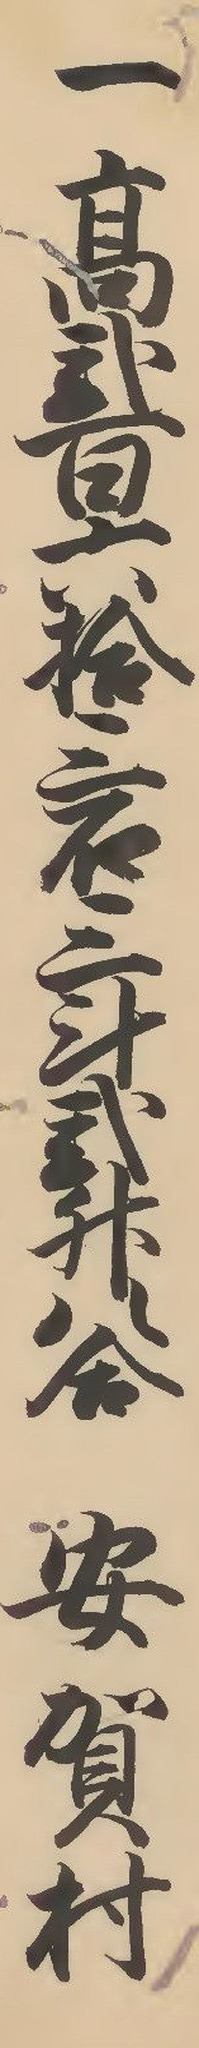一髙弐百六拾三石三斗弐升八合安賀村
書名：播磨国郷帳
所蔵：国立公文書館 National Archives of Japan
